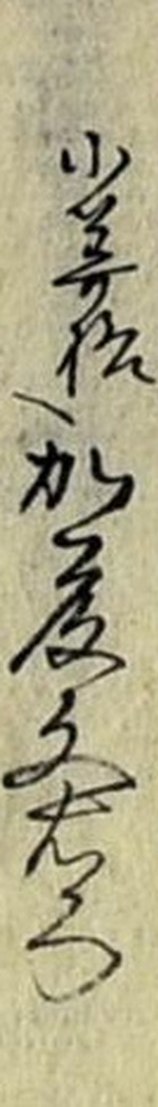小算格加藤文右衛門
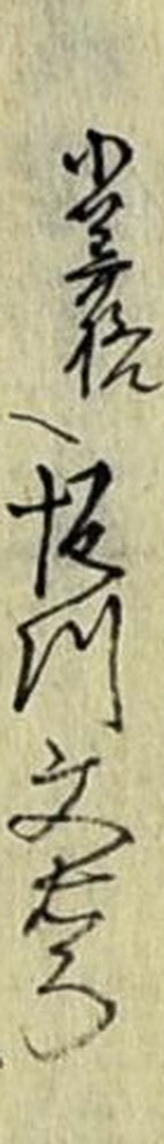小算格坂川文右衛門
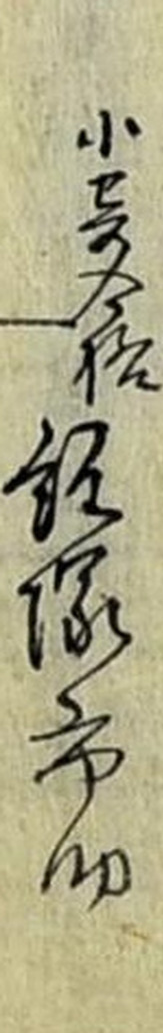小寄合格飯塚市助
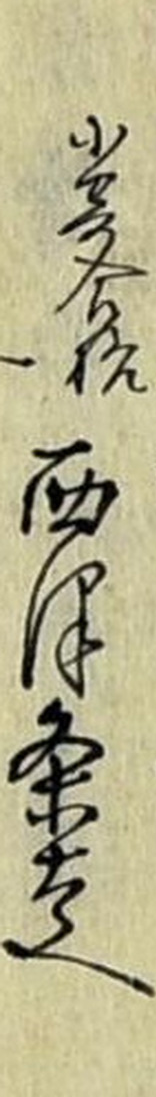小寄合格西沢粂太夫
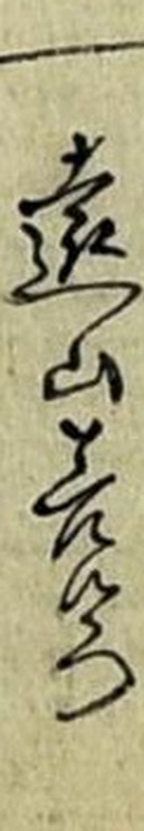遠山喜左衛門
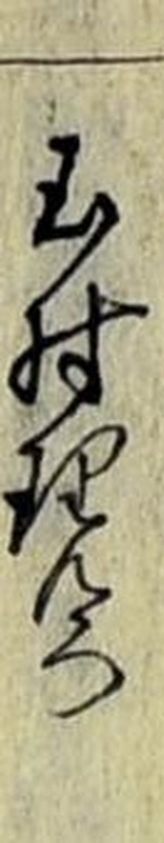玉村理左衛門
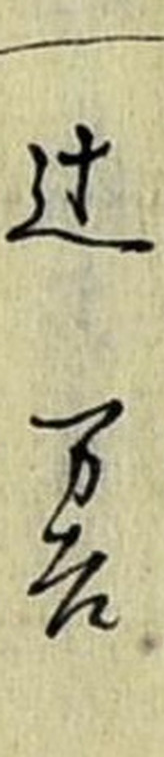辻万吉
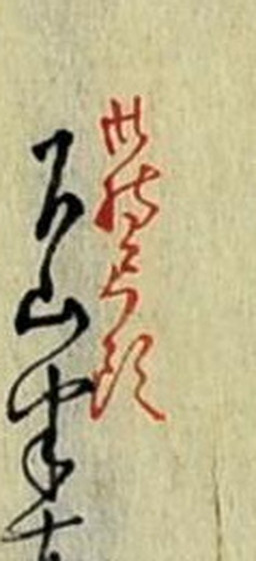御持弓頭
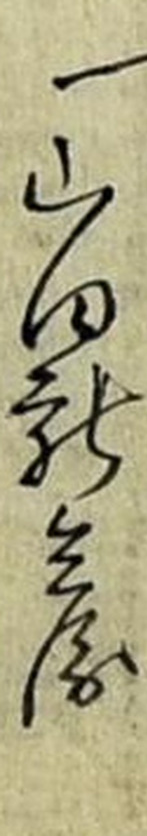山田新兵衛
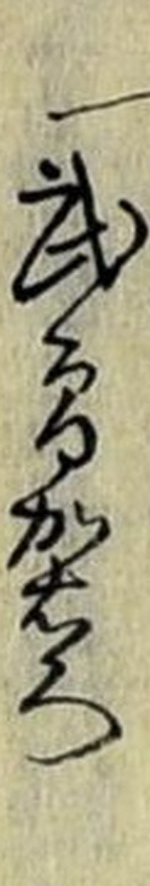武曽加右衛門
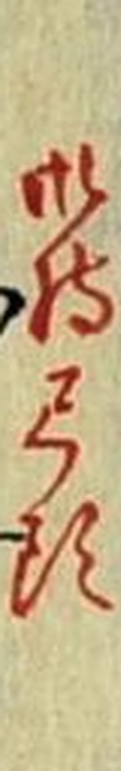御持弓頭
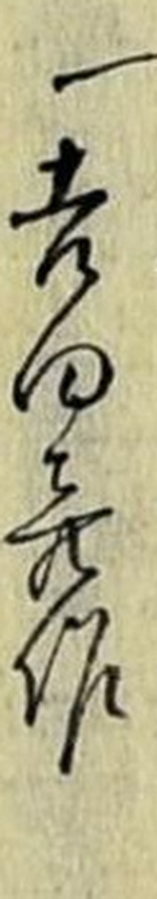吉田喜作
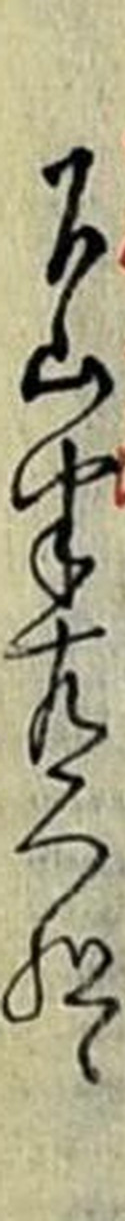下山半左衛門組へ
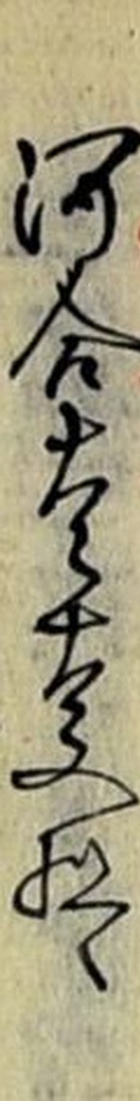河合太郎太夫組へ
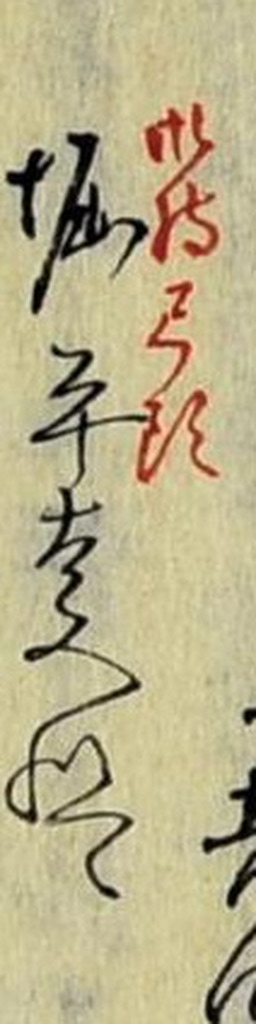堀平太夫組へ
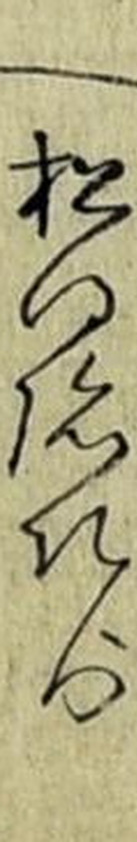伊藤弥左衛門
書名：命令之部 四
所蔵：福井県文書館 Fukui Prefectural Archives
